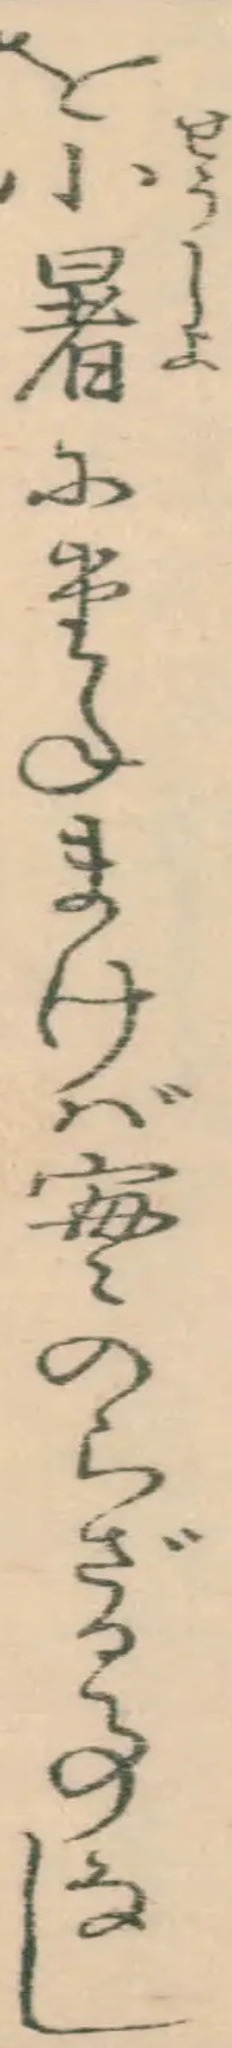を小暑にたねまけバ実のらざる事なし
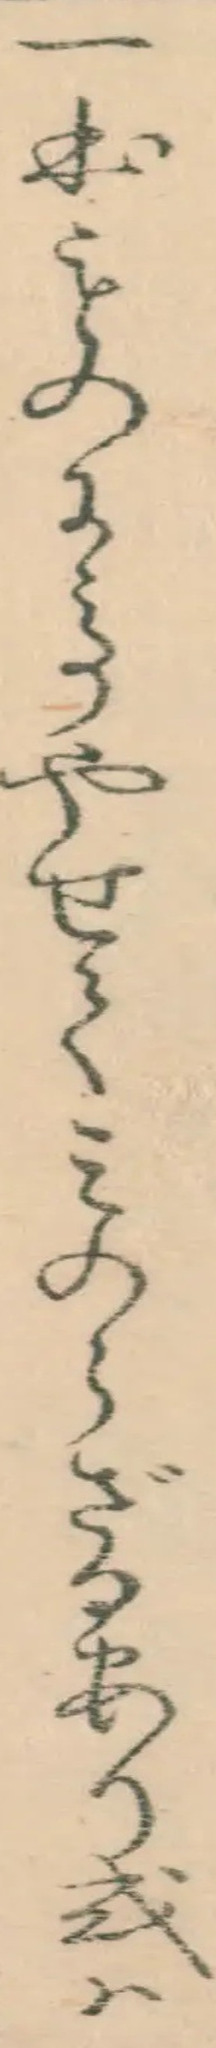一本ものにてやせてミのらざるあり或ハ
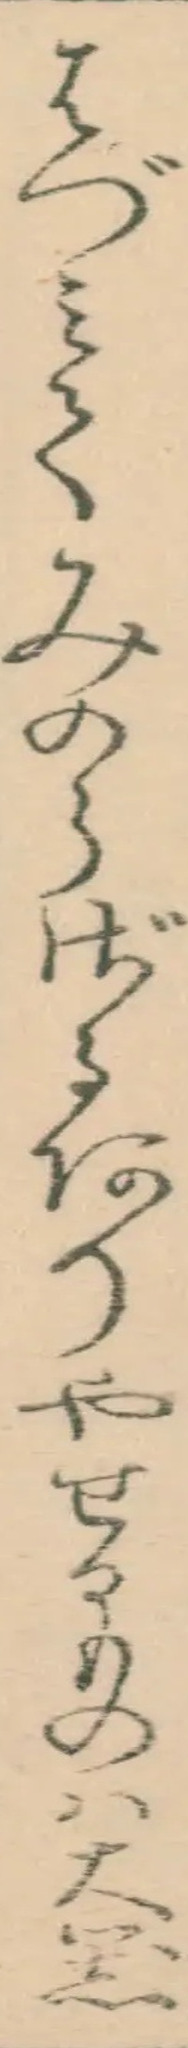はづミてみのらざるありやせるものハ大器
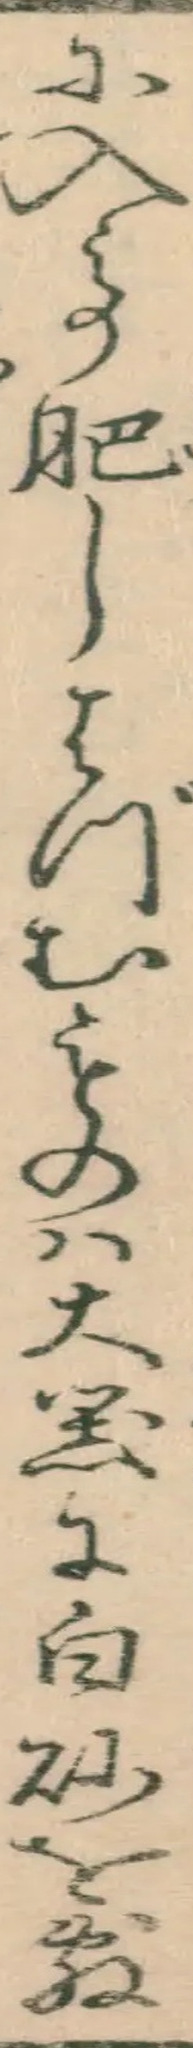に入て肥しはづむものハ大器に白砂を敷
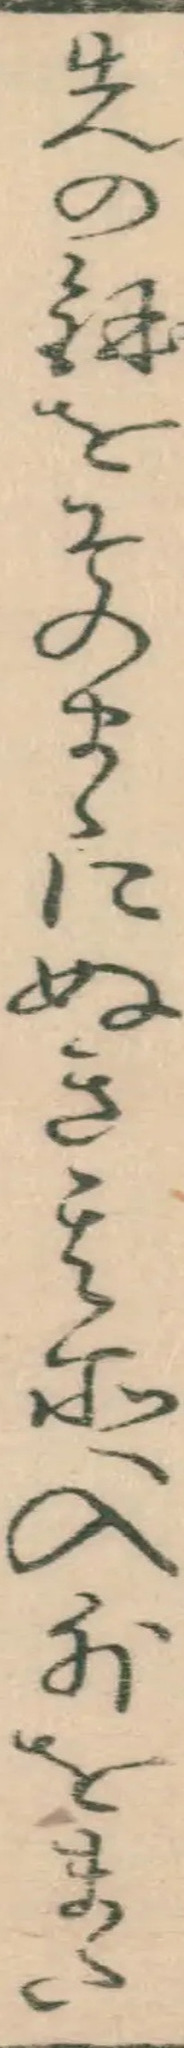先の鉢をそのまゝにぬき其所へ入外をまた
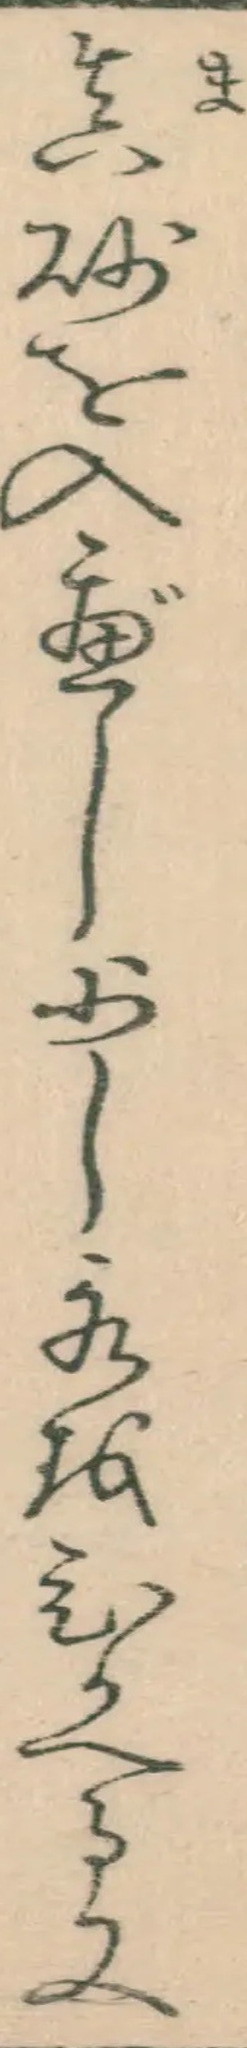真砂を入べし少し水をひかへる又
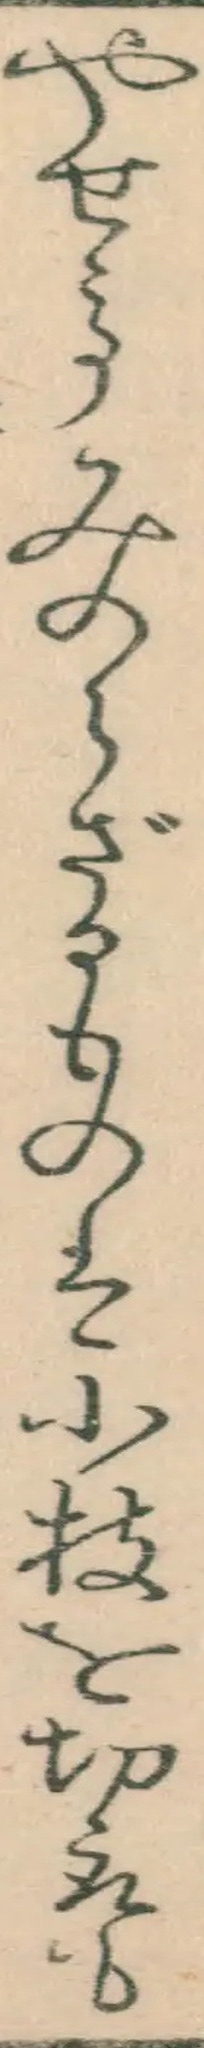やせてみのらざるものは小枝切取も
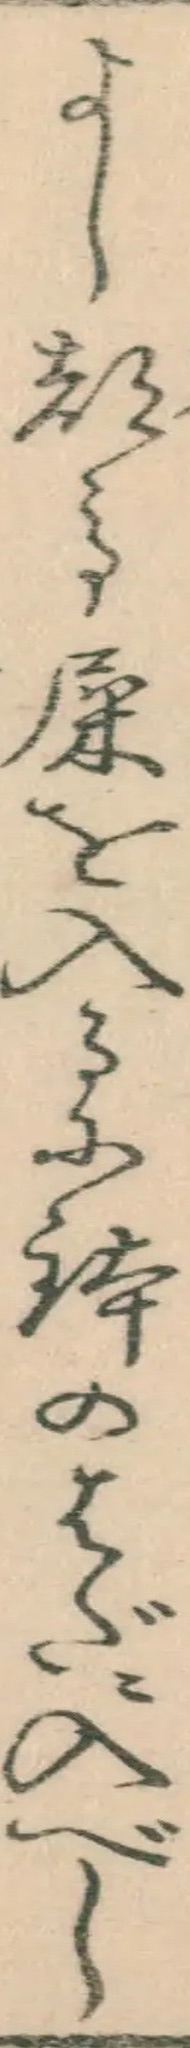よし都て屎を入るに鉢のはだニ入べし
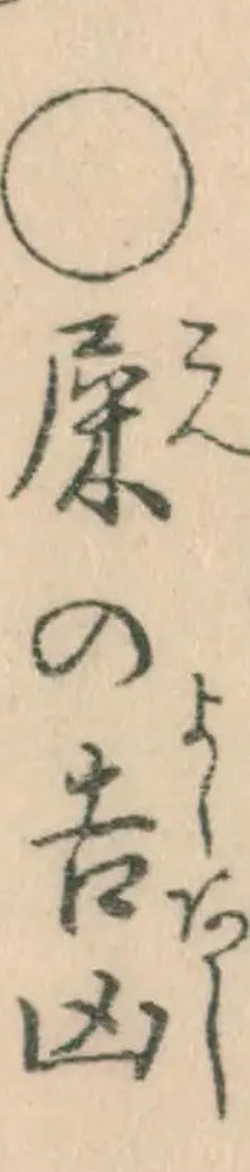〇屎の吉凶
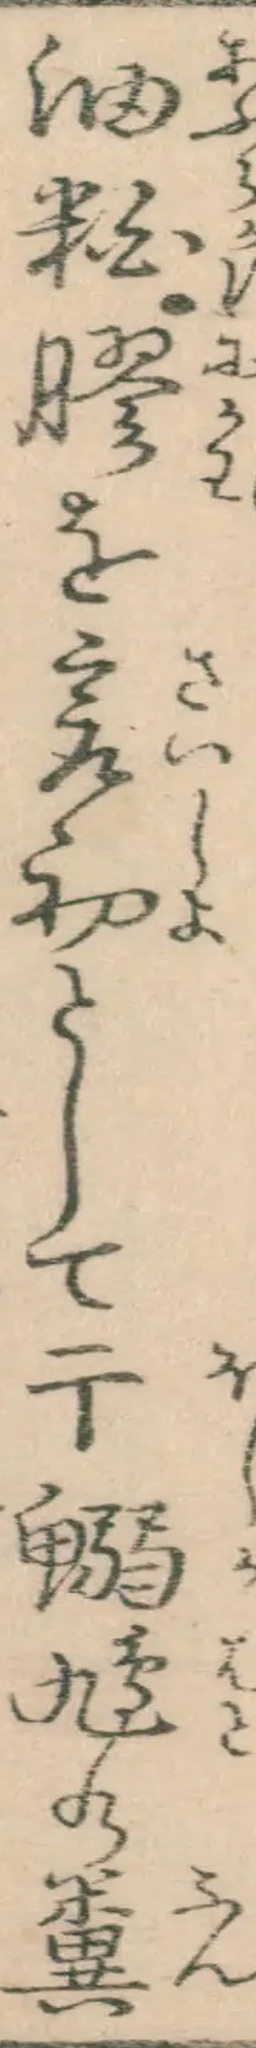油粕膠を最初として干鰯鳩の糞
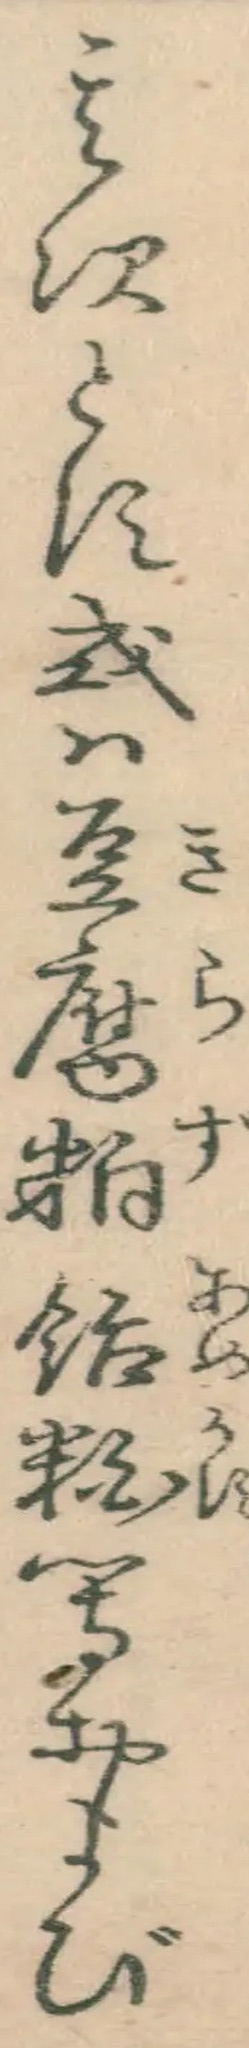其次或ハ豆腐粕飴粕等および

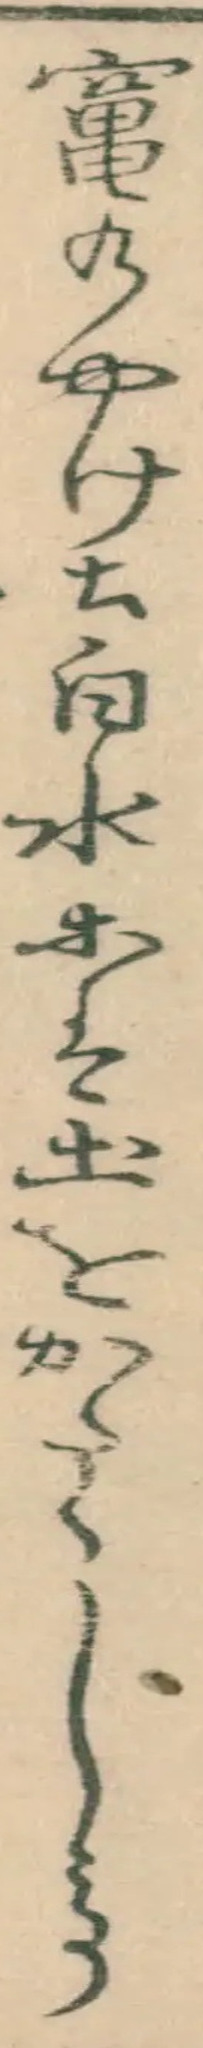竃のやけ土白水等は土をかたくして
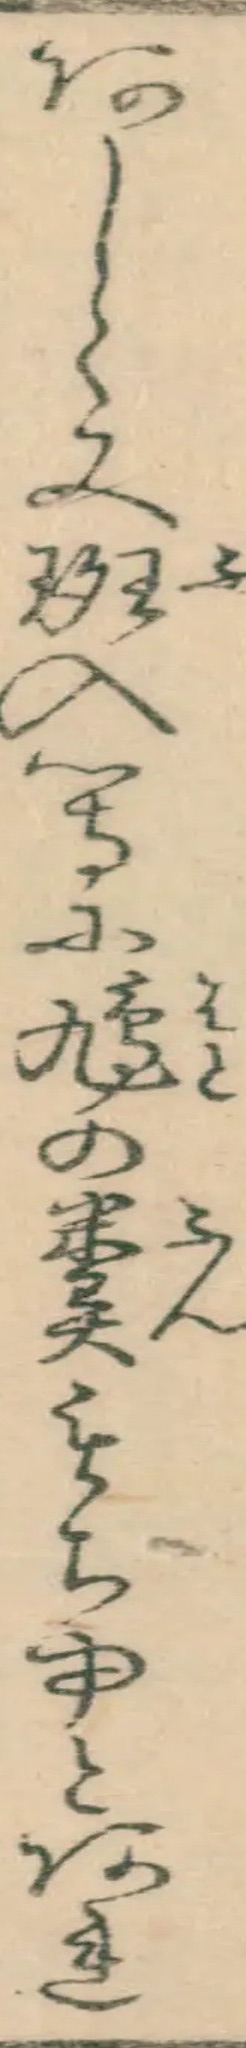あしく叉斑入等に鳩の糞もちゆとあれ
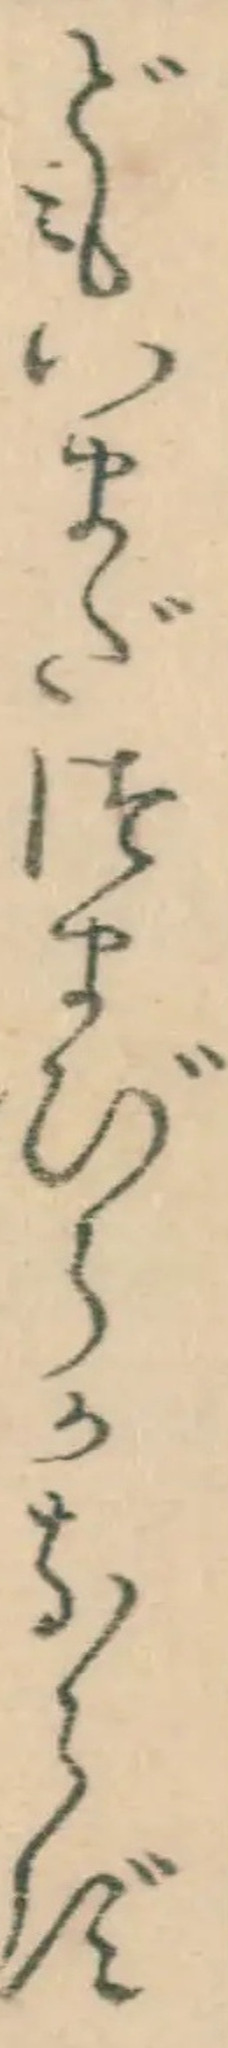どもいまだつまびらかならず
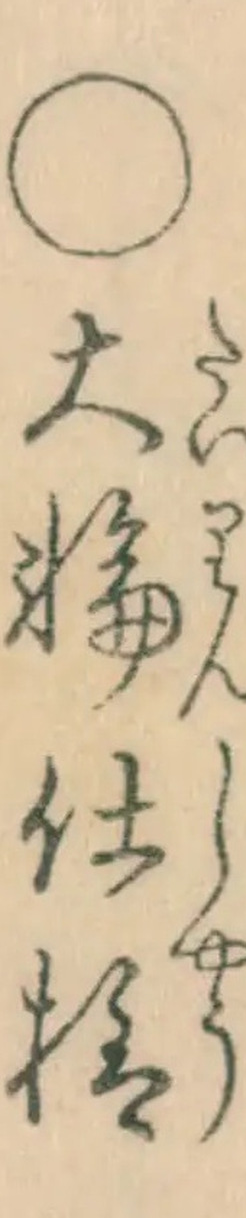〇大輪仕様
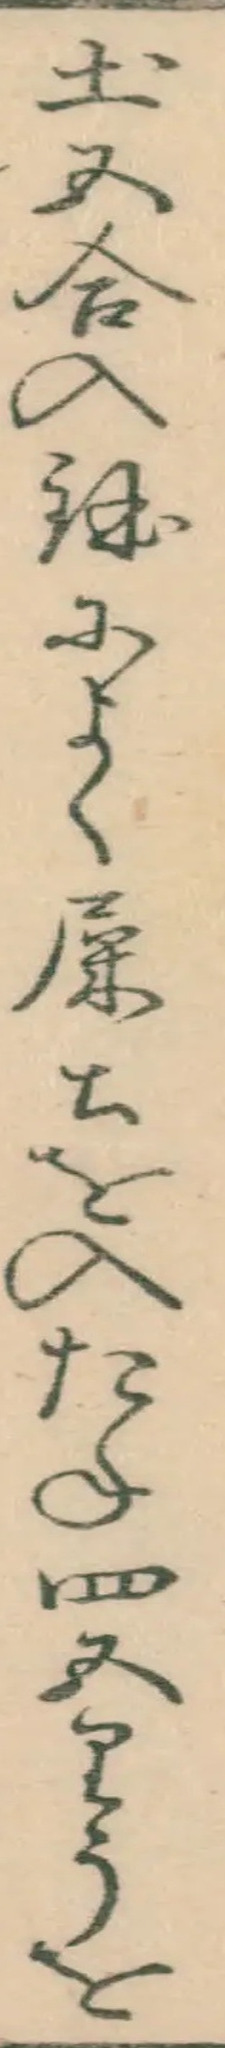土五合入鉢によく屎土を入たね四五りうを
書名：花壇朝顔通 2巻. [2]
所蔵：国立国会図書館 National Diet Library, JAPAN
